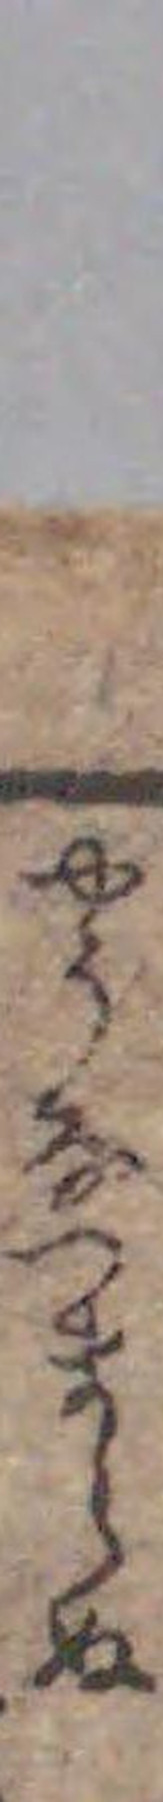やうなつまらぬ
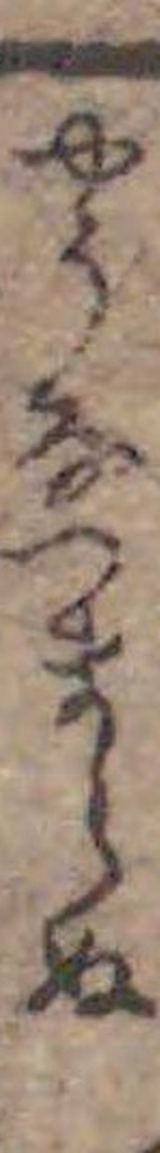やうなつまらぬ
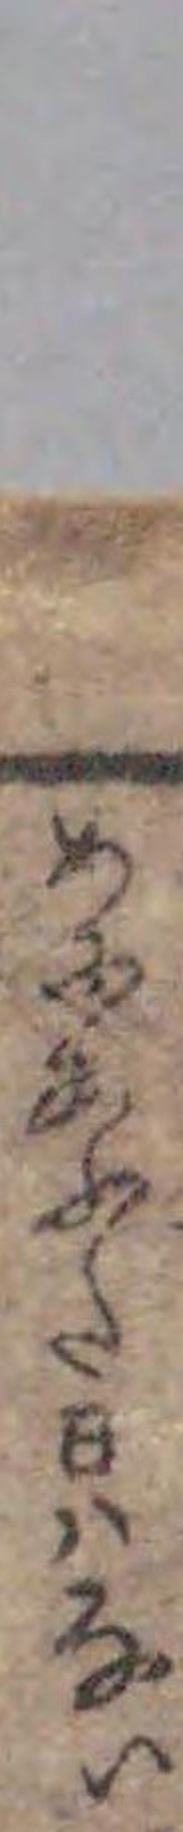めにあふた日はない
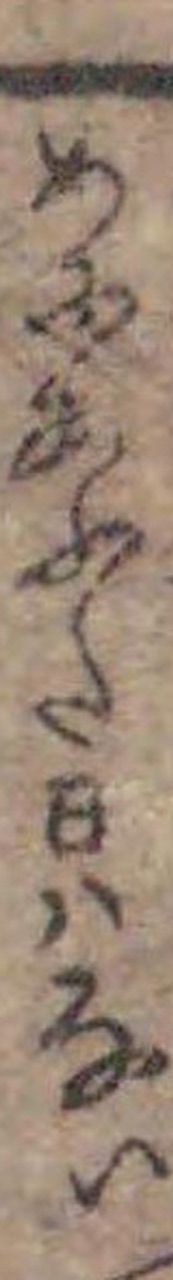めにあふた日はない
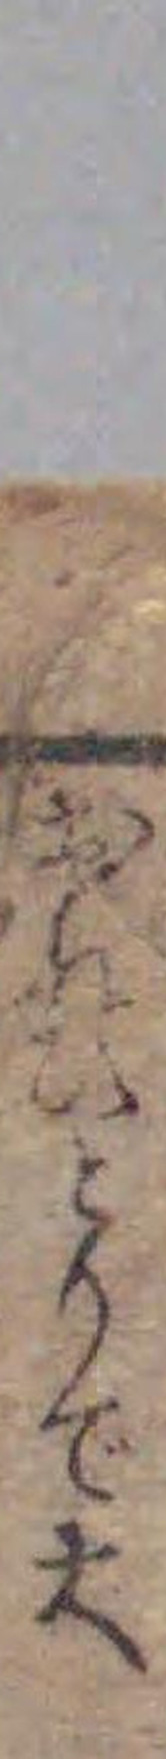おれひとりで大
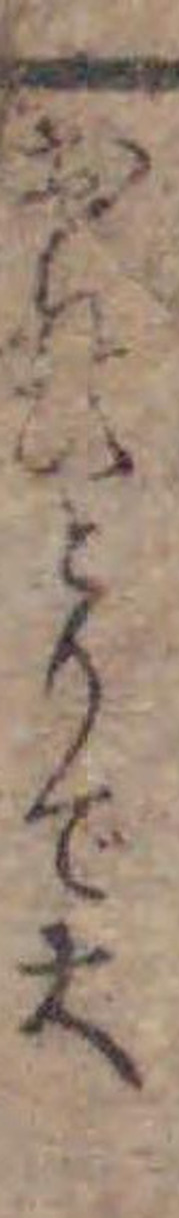おれひとりで大
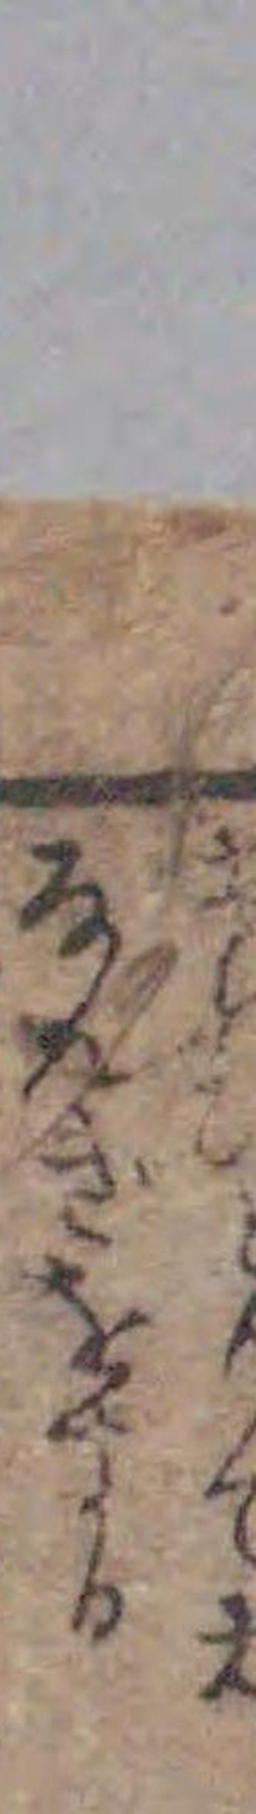なんぎをする
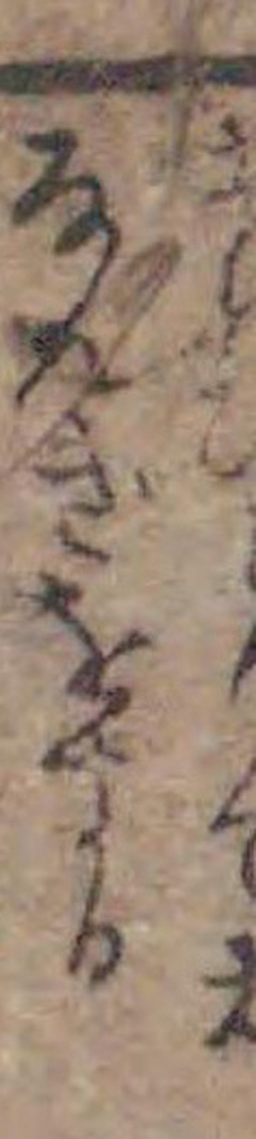なんぎをする
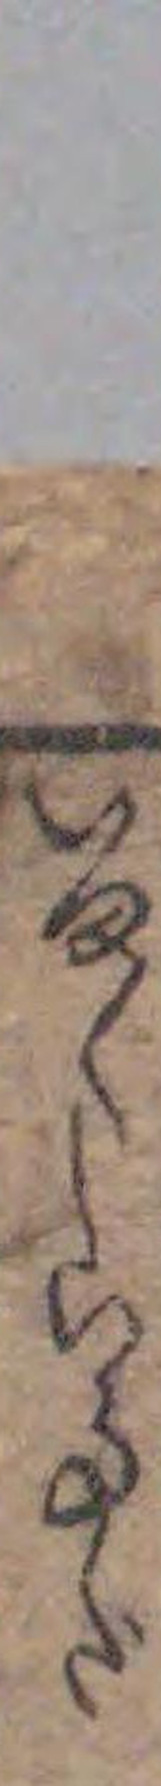いま〳〵しい事だ
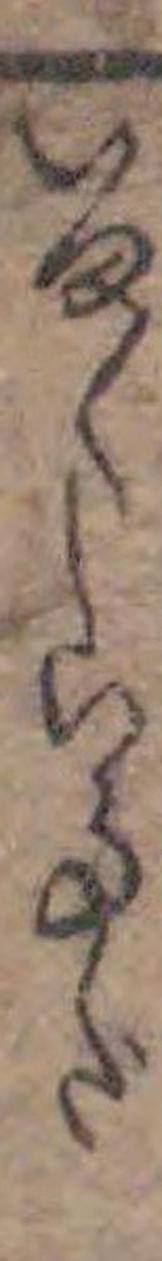いま〳〵しい事だ

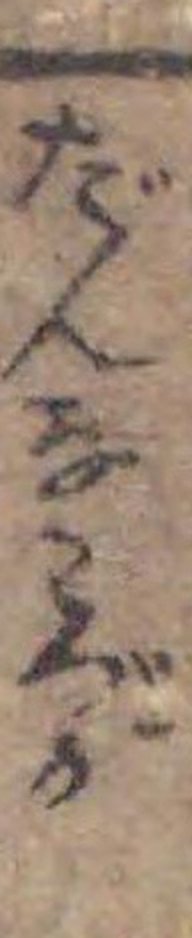だんなわづか
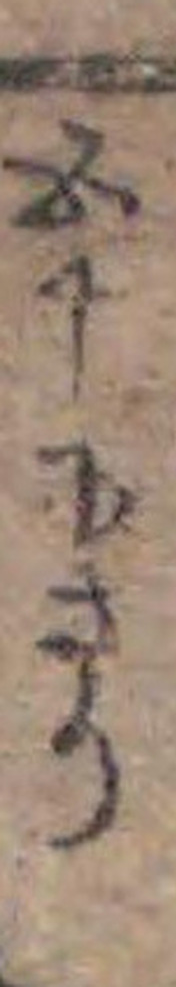五十下さり
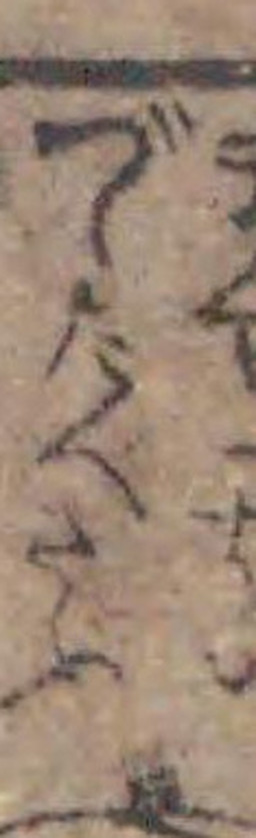づゝたべたふ
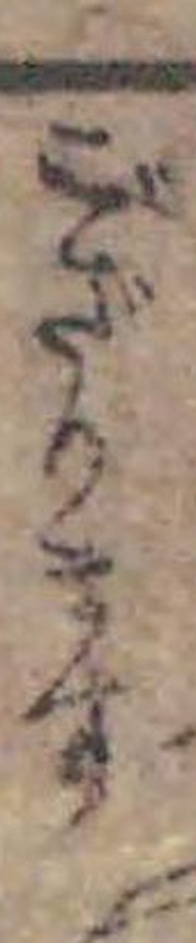ござります
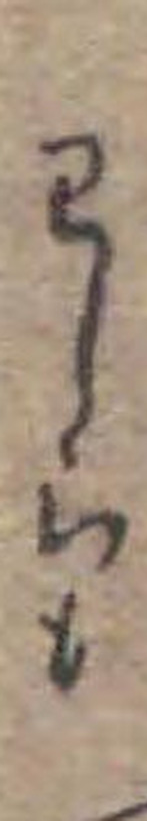わしらも
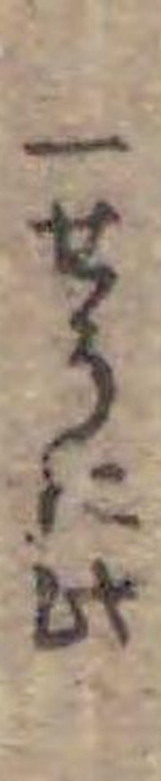一せうに此
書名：蛭子大黒壮年過 : 2巻
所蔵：国立国会図書館 National Diet Library, JAPAN
